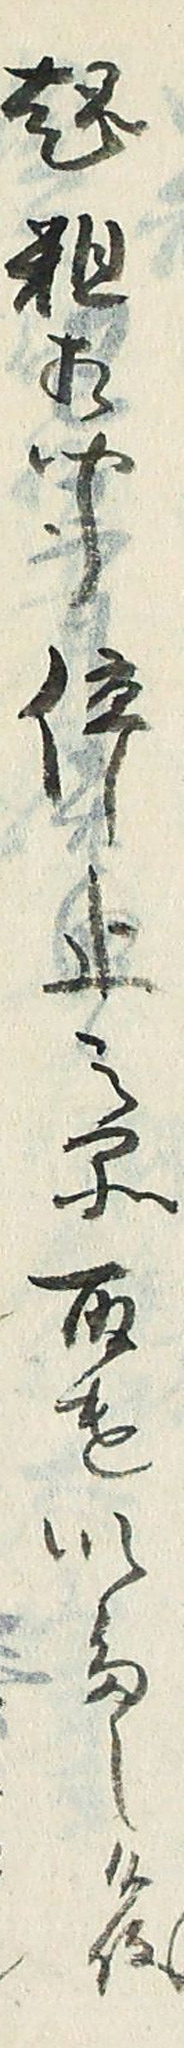趣粗相聞停止之品取遣いたし候儀
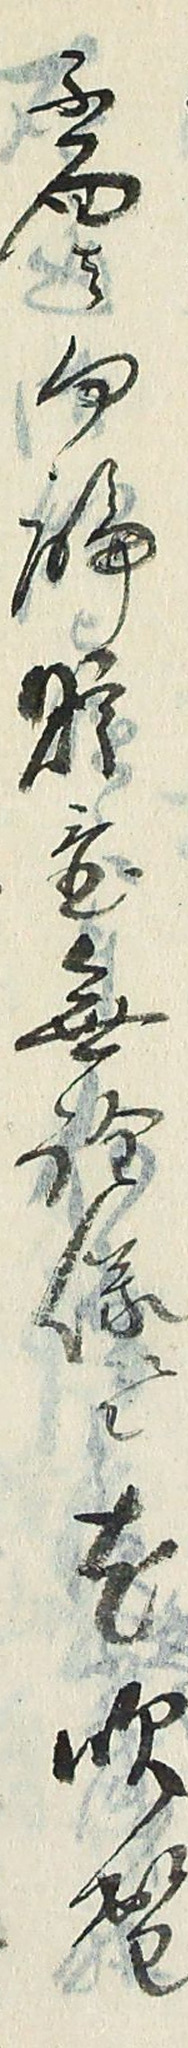不届は勿論貯置無詮儀に候尤吹替
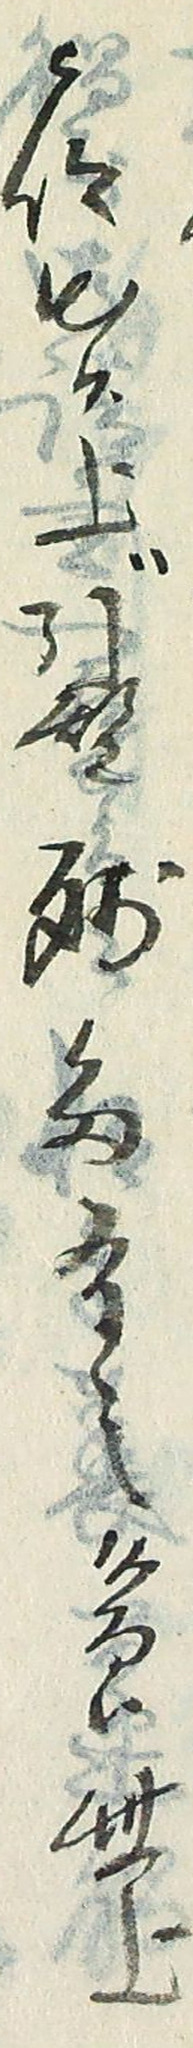被仰出候上は引替残多有之候ては世上
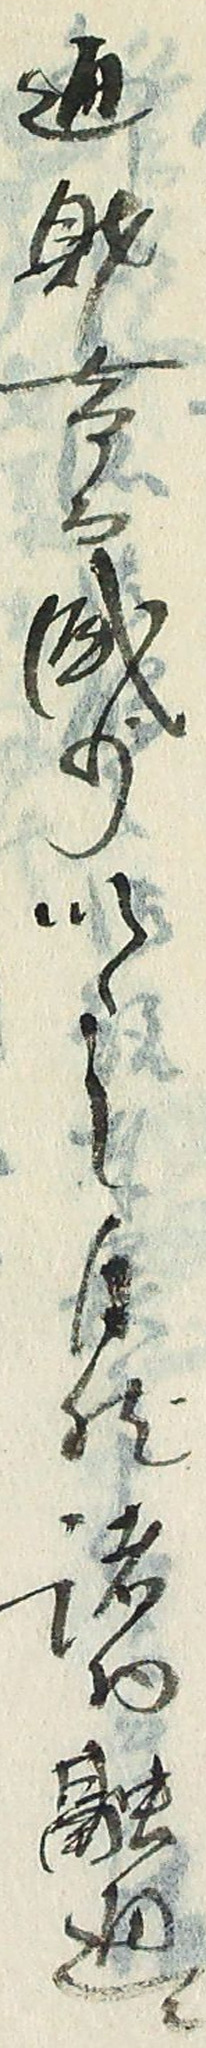通財却て減少いたし自然諸物融通に
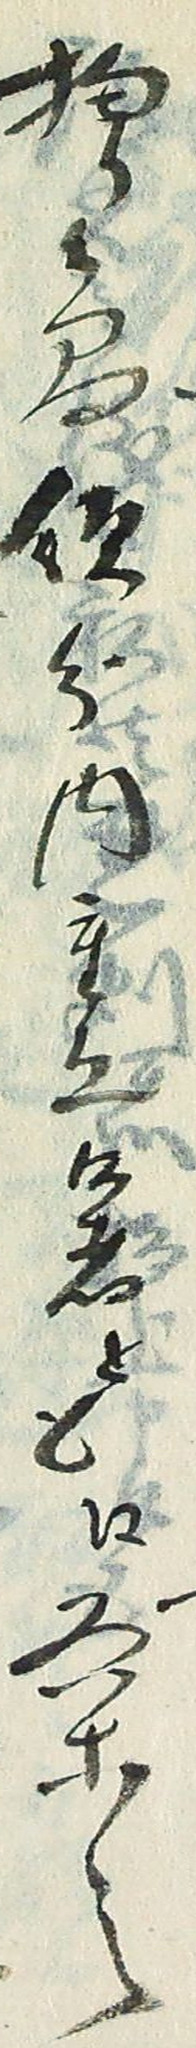拘り候間領分内重立候者とも江右等之
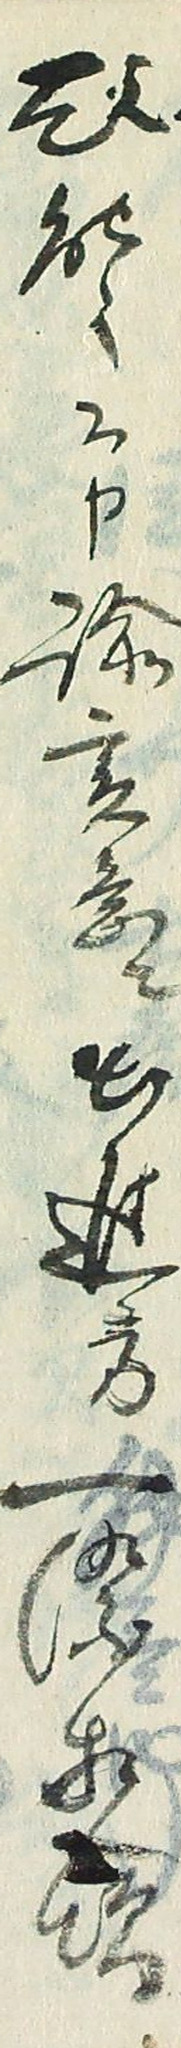趣能々被申諭実意に出進方一際相増
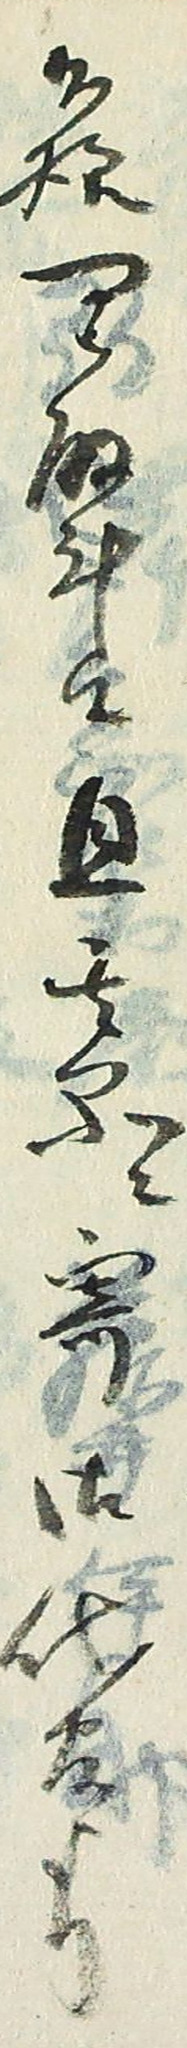候様可被取計候且其品に寄御代官より
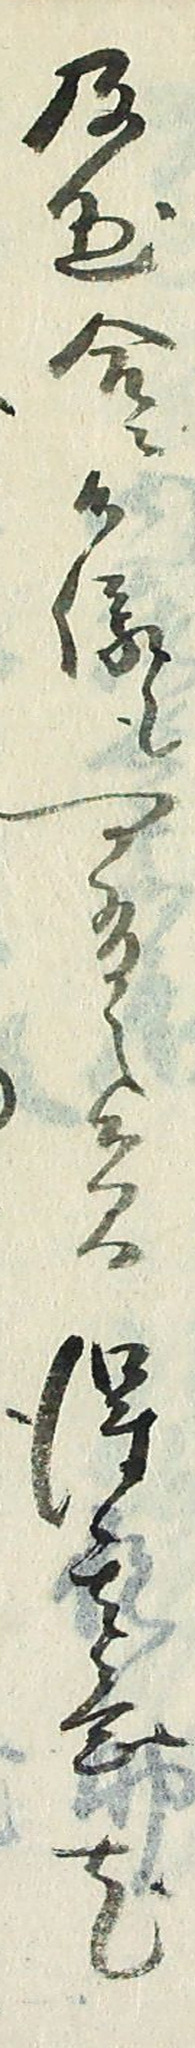及懸合に候儀も可有之候間得其意尤
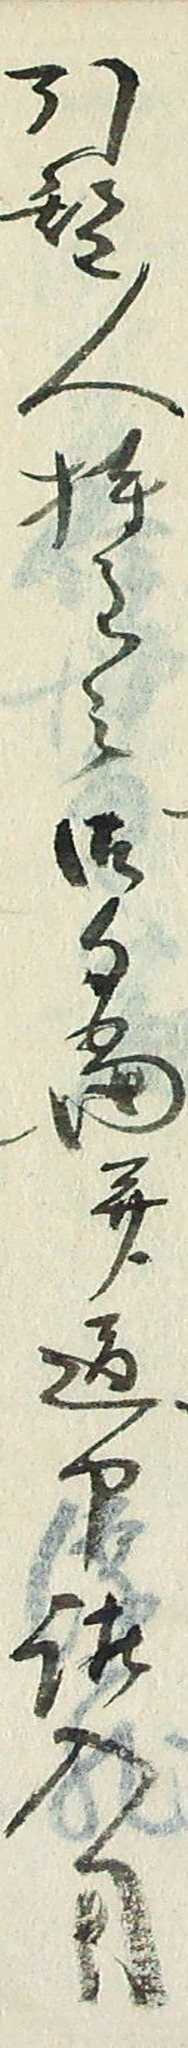引替人持主之御手当幷道中諸入用
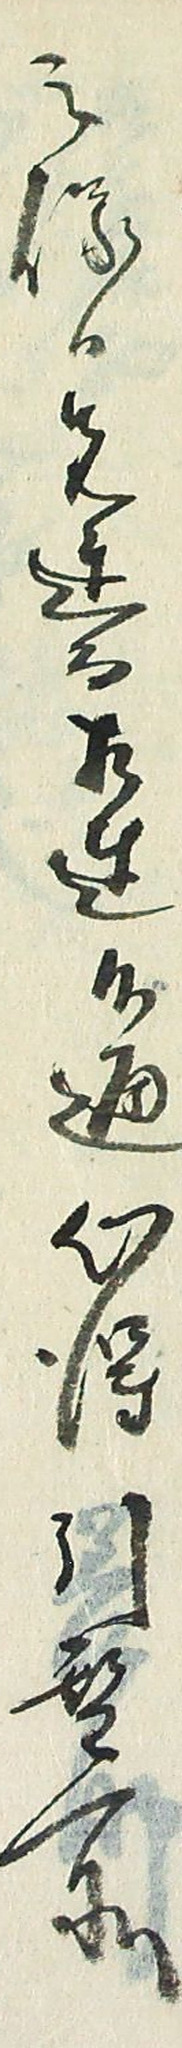之儀は先達而相達候通心得引替所
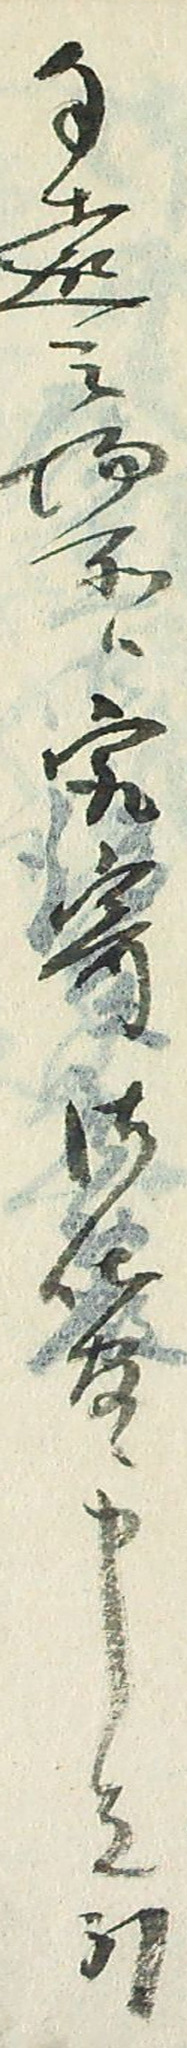手遠之場所は最寄御代官へ申立引
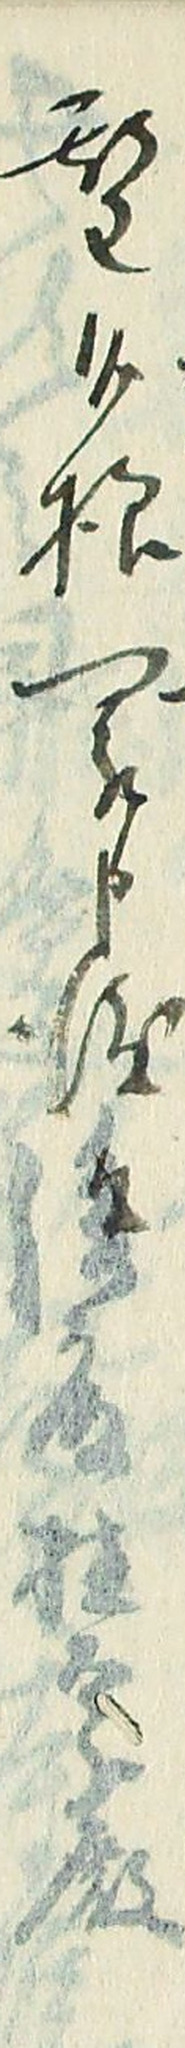替候様可被申渡候
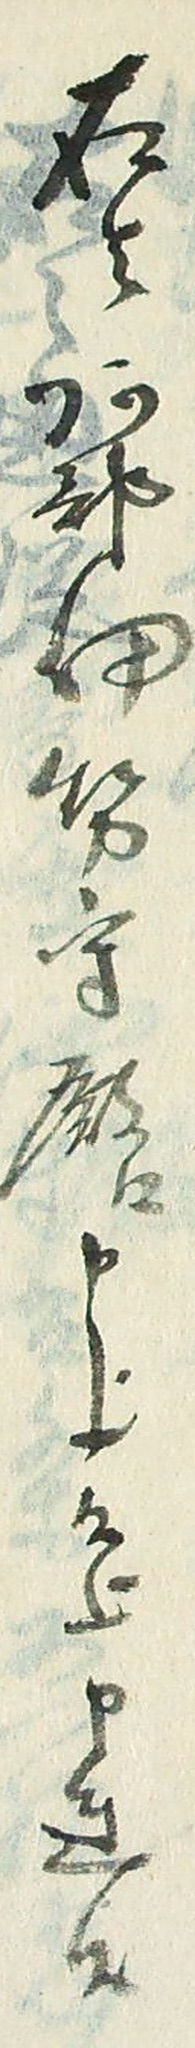右は阿部伊勢守殿江申上候上申達候
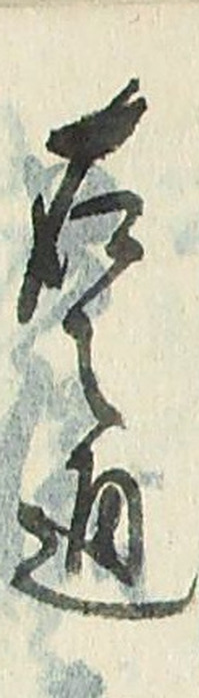右之通

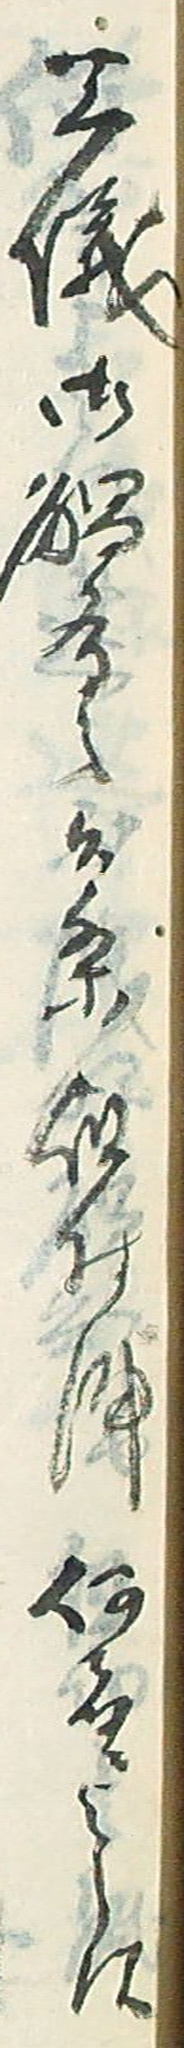公儀御触有之候条組村浦何者によらす
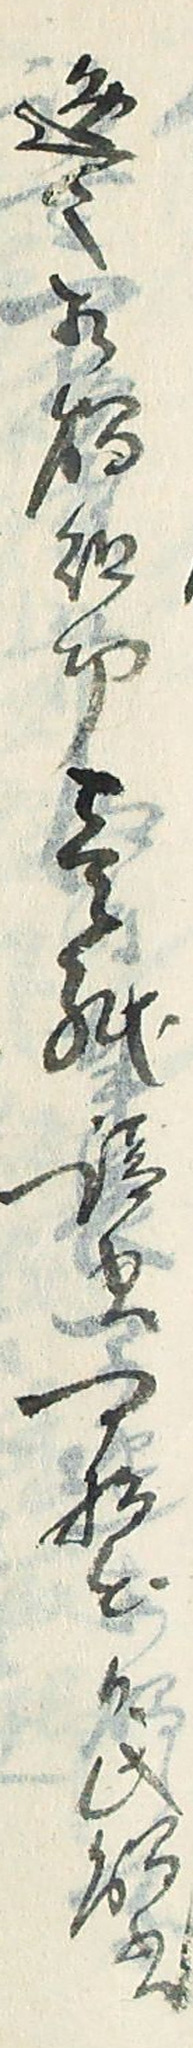逸々相触組切壱紙請書可指出候此触書
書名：諸御用御□受書控
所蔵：鳴門教育大学 Naruto University of Education
